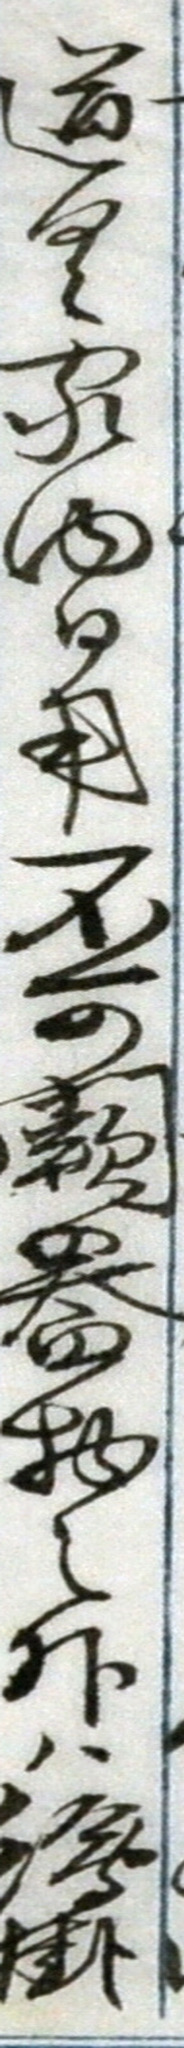道具家内日用不可闕器物之外ハ絵掛
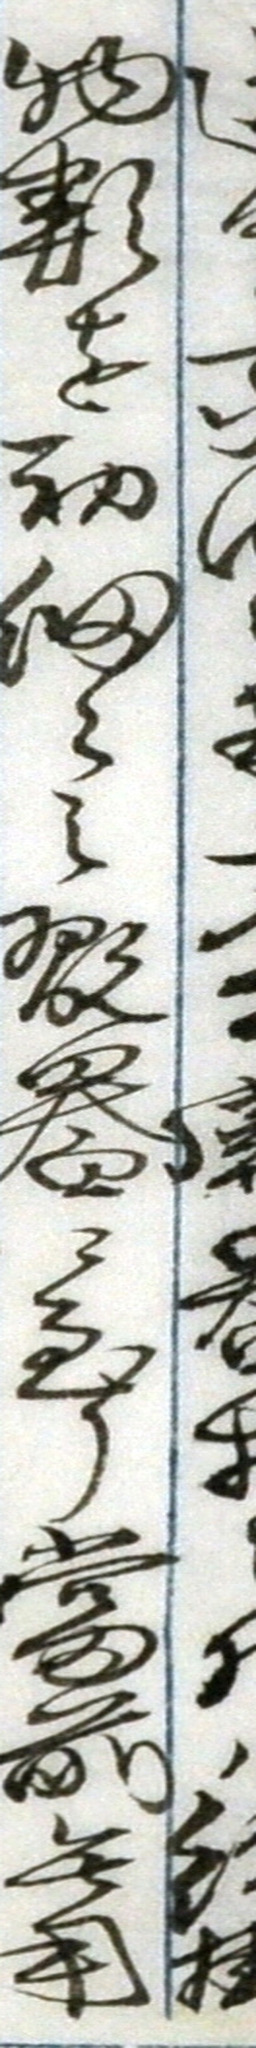物類を初細々之翫器ニ至り当前無用
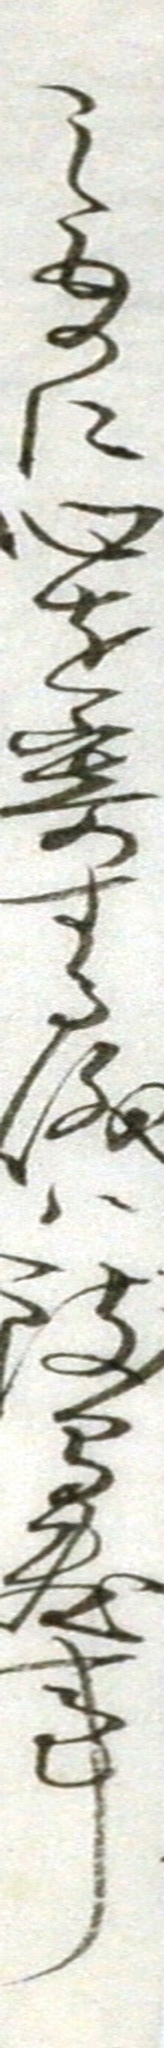之ものに心を寄する儀ハ致間敷事
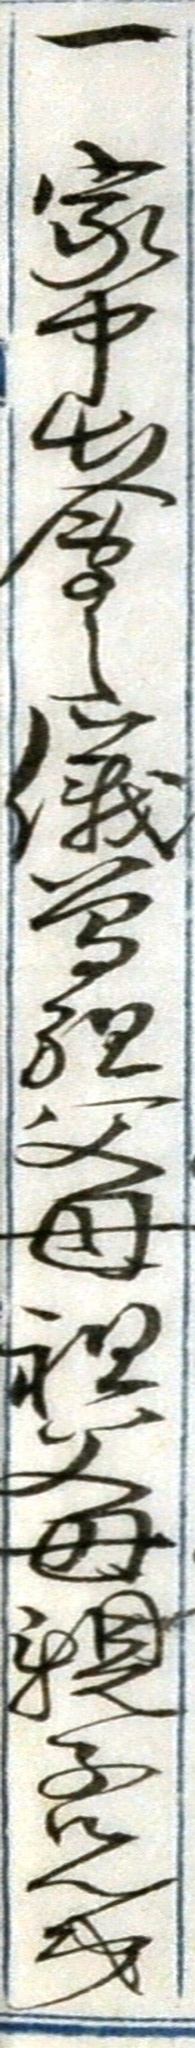一家中出会之儀曽祖父母祖父母親子兄弟

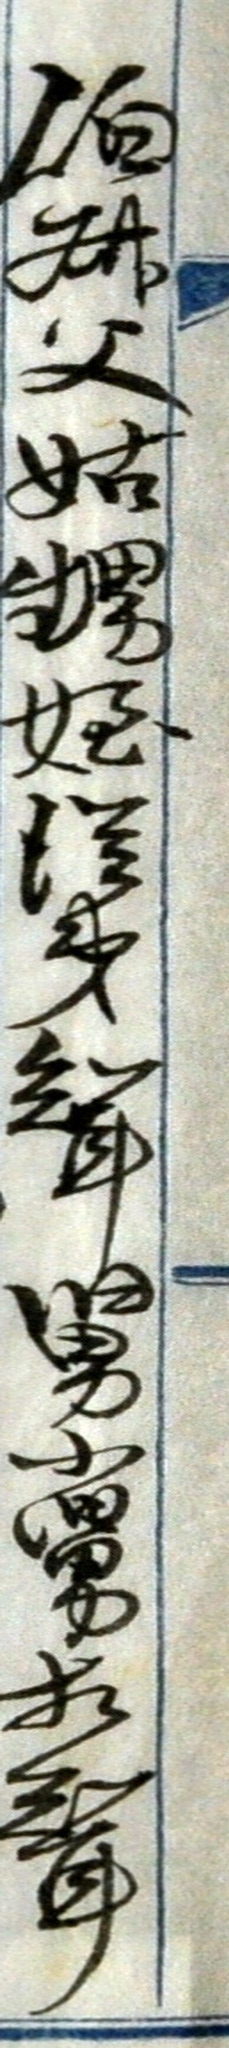伯叔父姑甥姪従弟聟舅小舅相聟
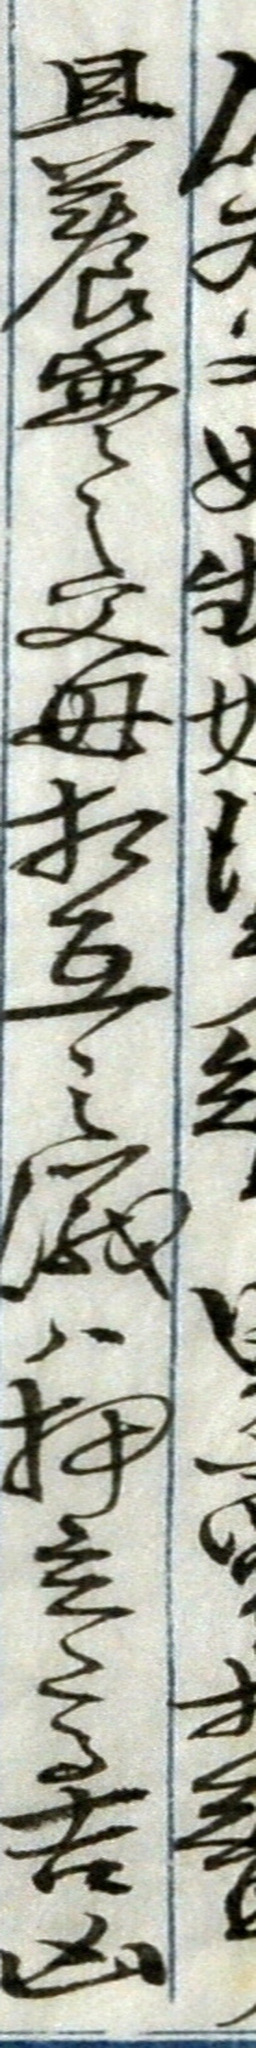且養実之父母相互之儀ハ押立高吉凶
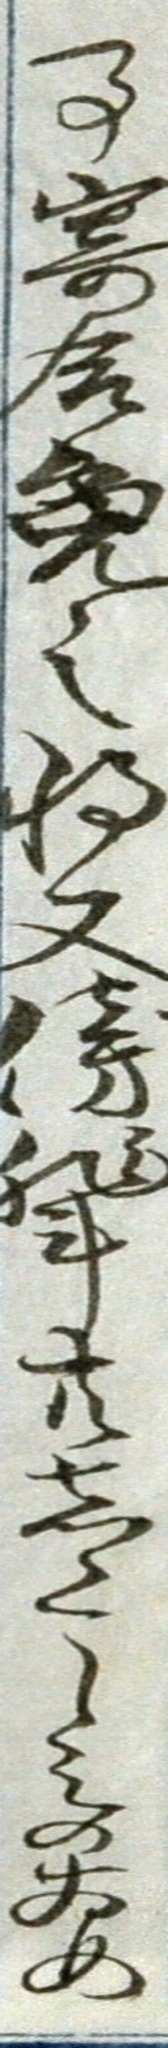事寄合免之将又傍輩共したしみの為め
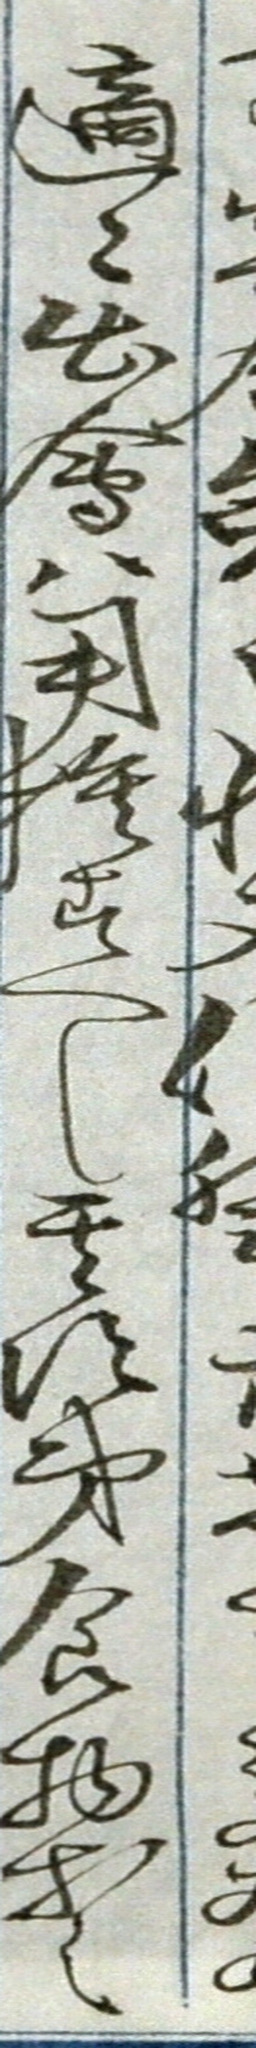適々出会ハ用捨すへし其次第食物等之
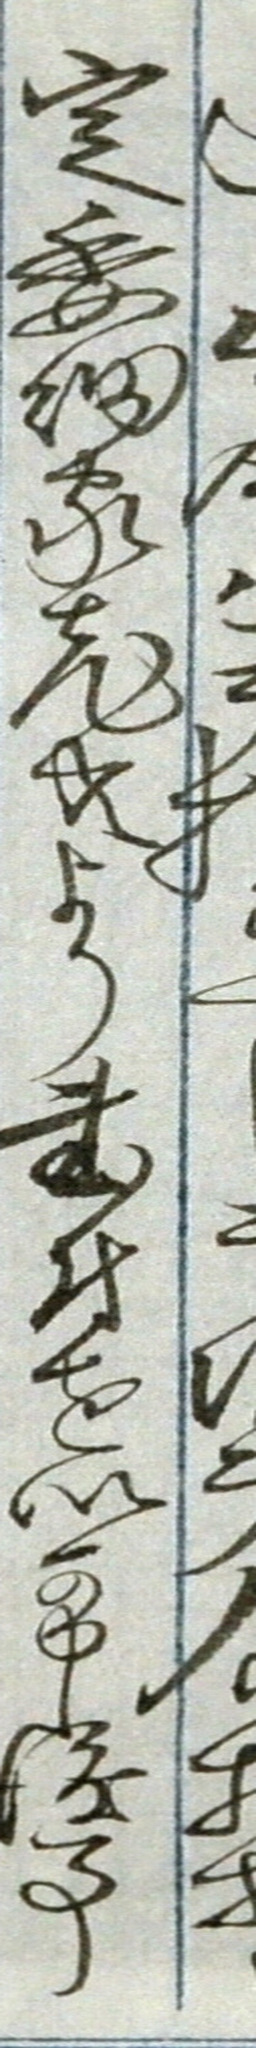定委細家老共より書付を以可申渡事
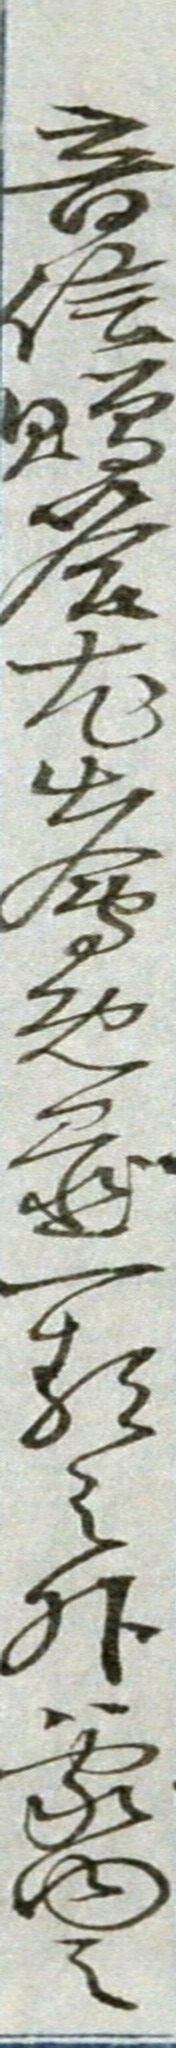一音信贈答尤出会免置一類之外ハ家内之
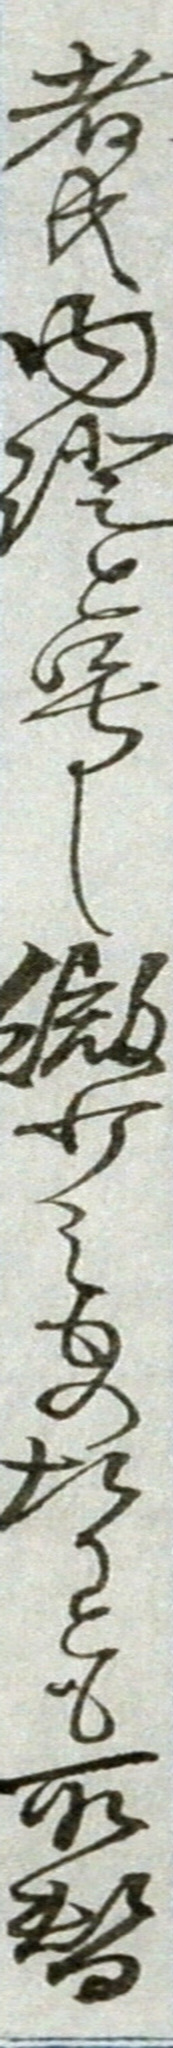者共内證と号し微少之ものたりとも取替
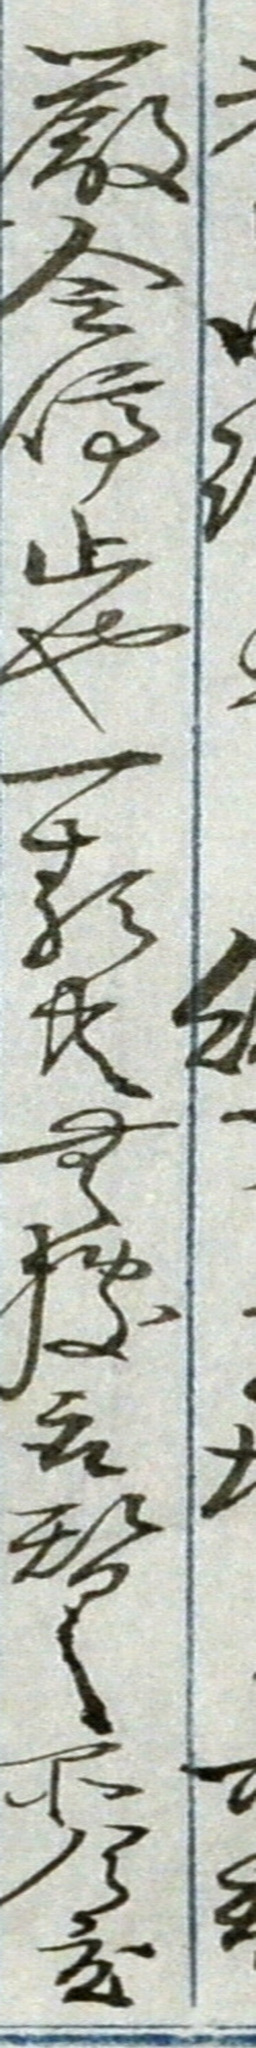厳令停止也一類共無拠取替之品今度
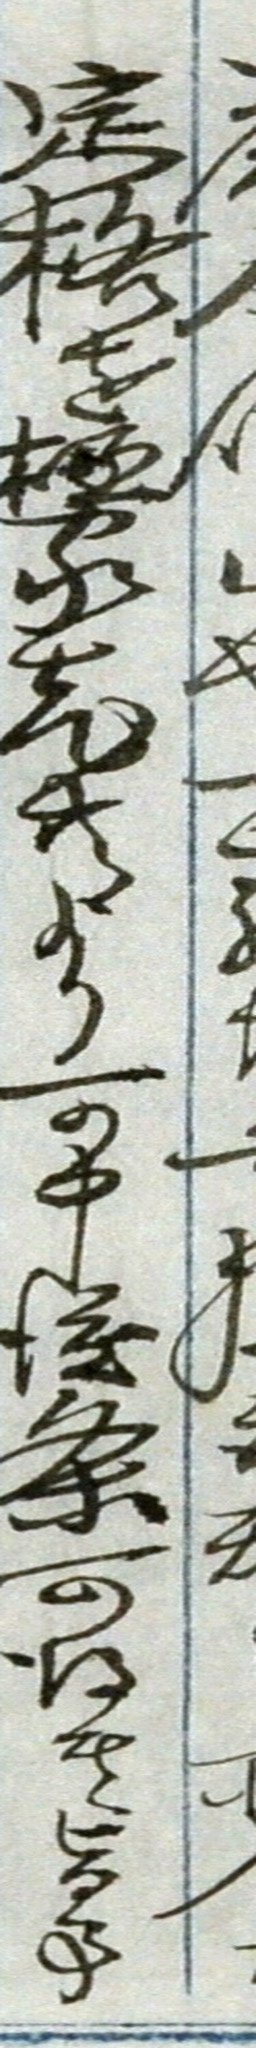定格を極家老共より可申渡条可得其旨事
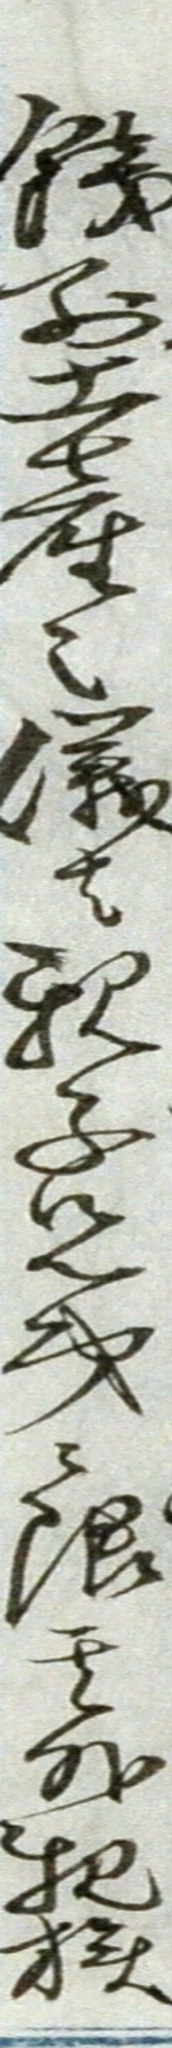一餞別土産之儀は親子兄弟ニ限其外親族
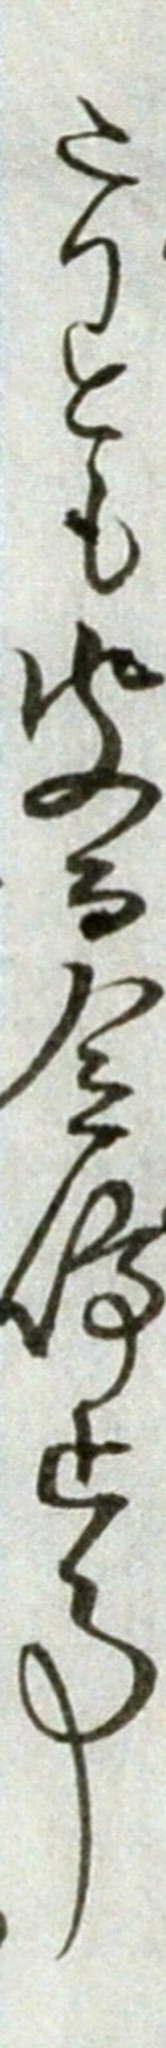たりとも決而令停止事
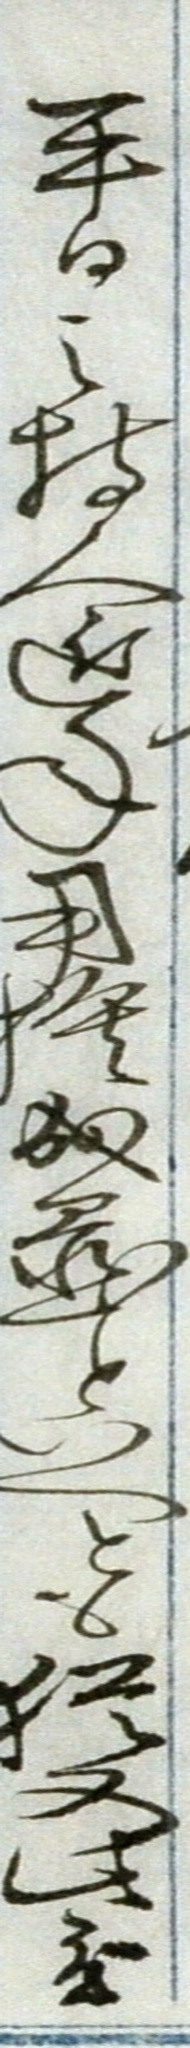一平日之村人近年用捨成置といへとも猶又此度
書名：頼由公御定書
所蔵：伊那市立高遠町図書館・合同会社AMANE
